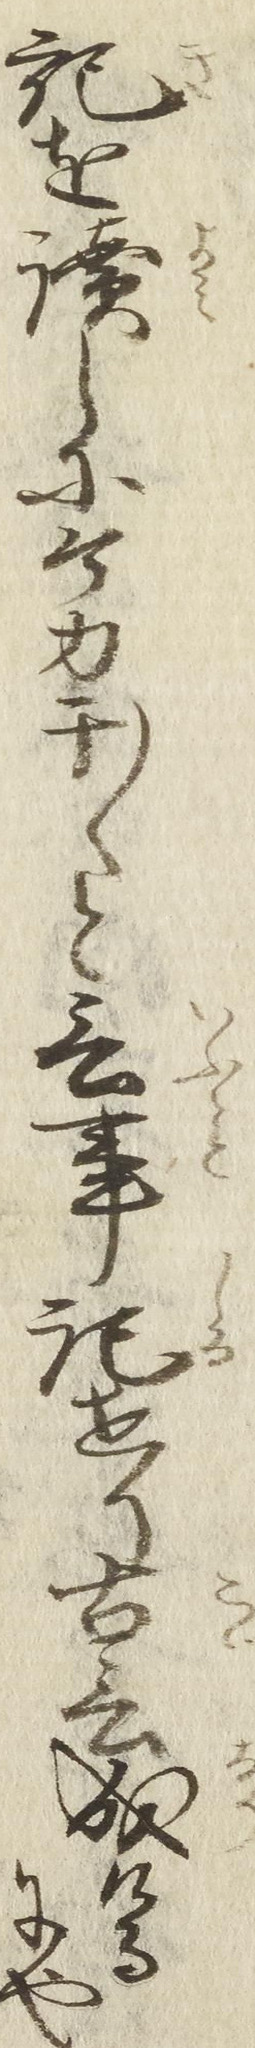記を読しにケカチ〳〵と言事記せり古言成けるにや
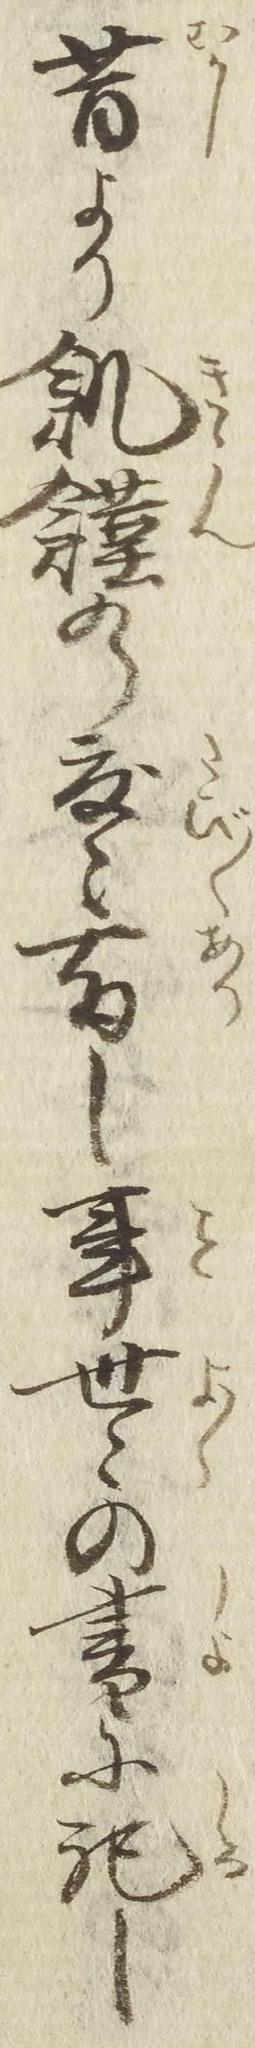昔より飢饉の度〻有し事世〻の書に記し
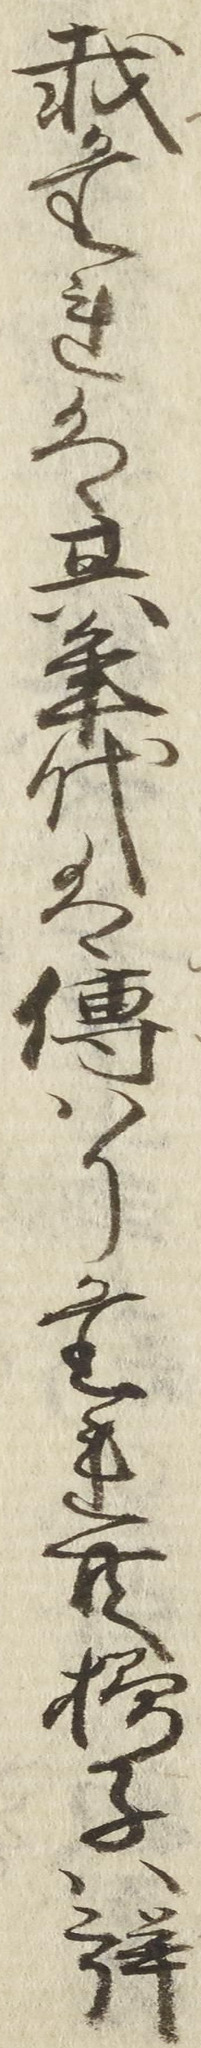載たれは其年代は伝はりたれ共様子は詳
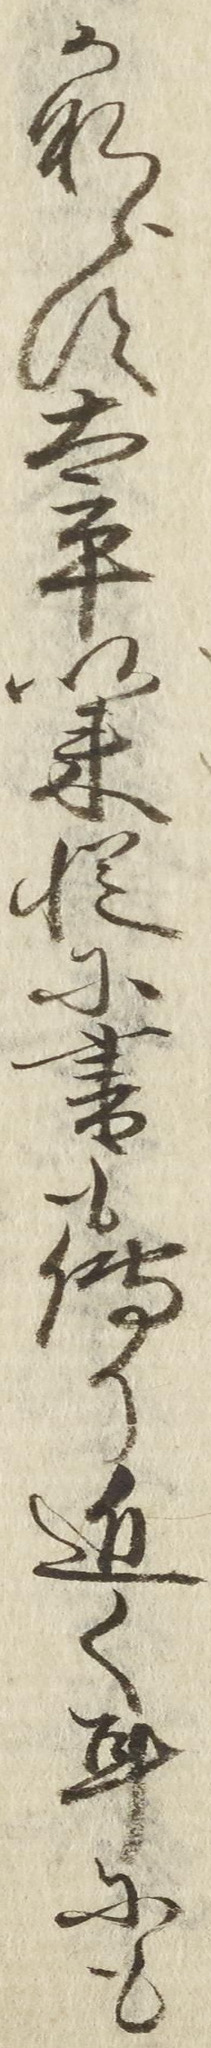かならす太平以来慥に書も伝り近く耳にも
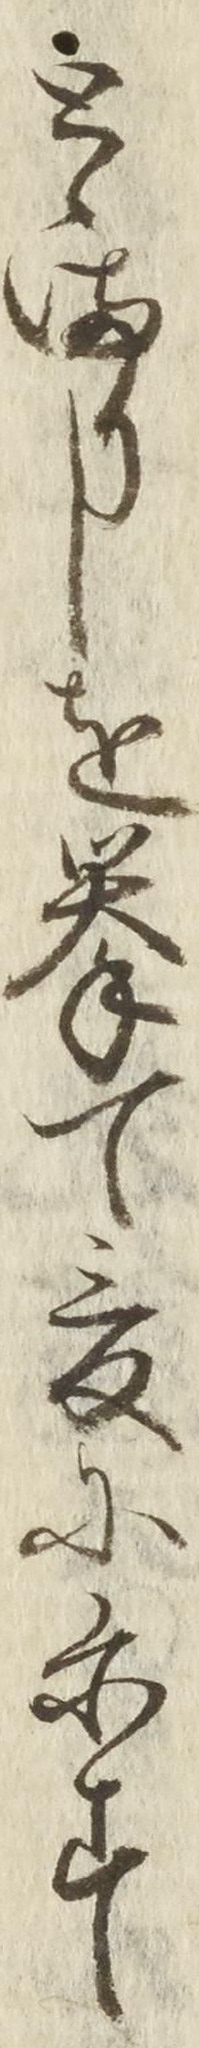とまりしを挙て爰に示す
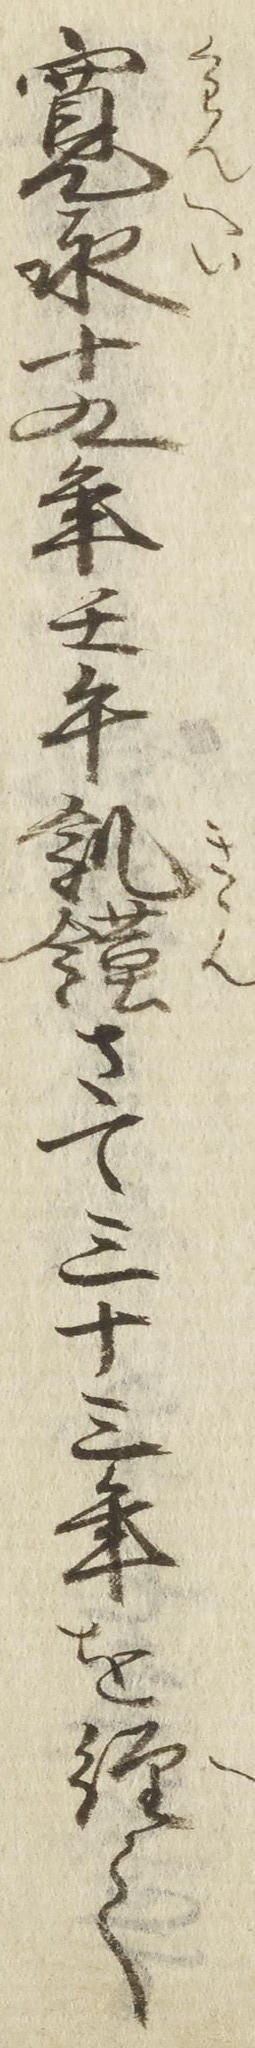寛永十九年壬午飢饉さて三十三年を経て

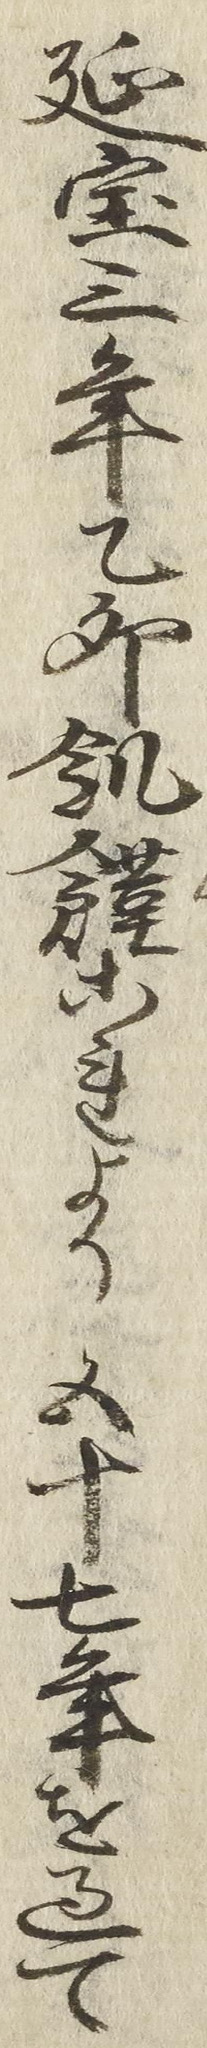延宝三年乙卯飢饉これより五十七年を過て
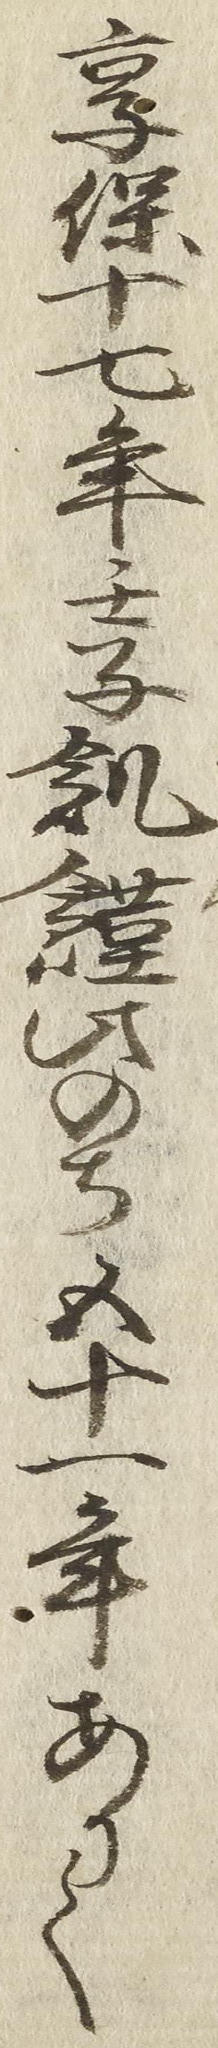享保十七年壬子飢饉此のち五十一年ありて
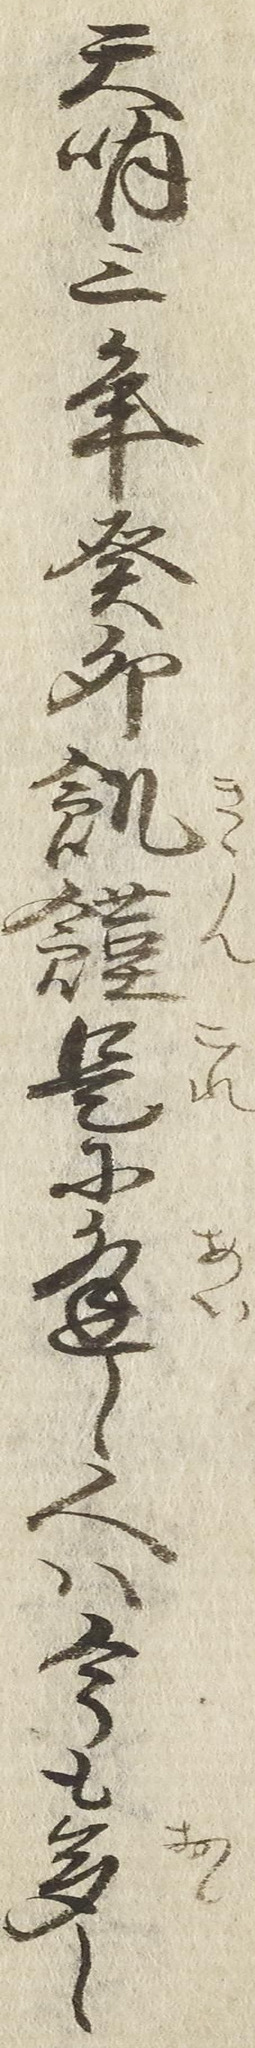天明三年癸卯飢饉是に逢し人は今も多し
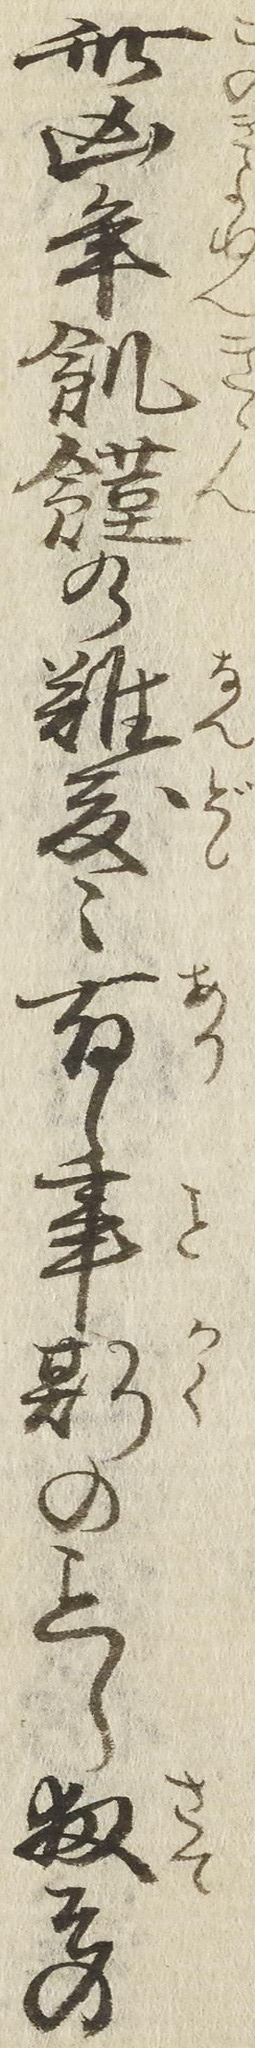此凶年飢饉の難度〻有し事斯のことし扨その
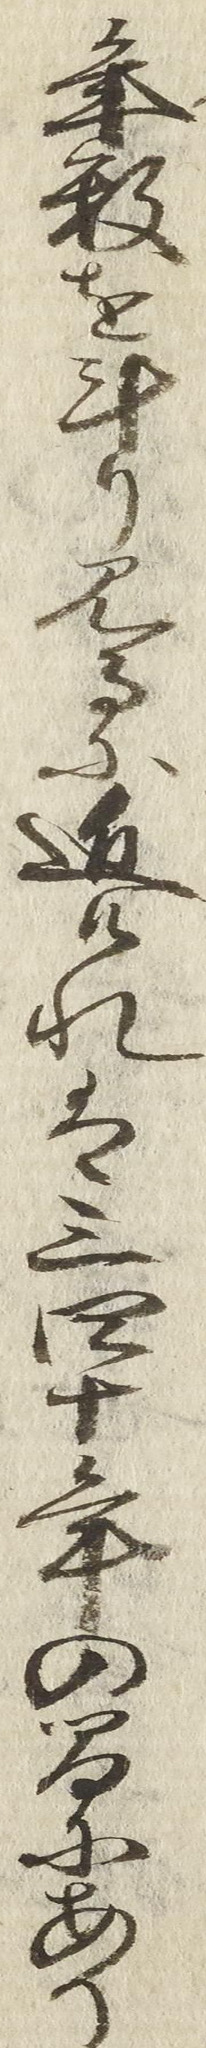年数を計り見るに近けれは三四十年の間にあり
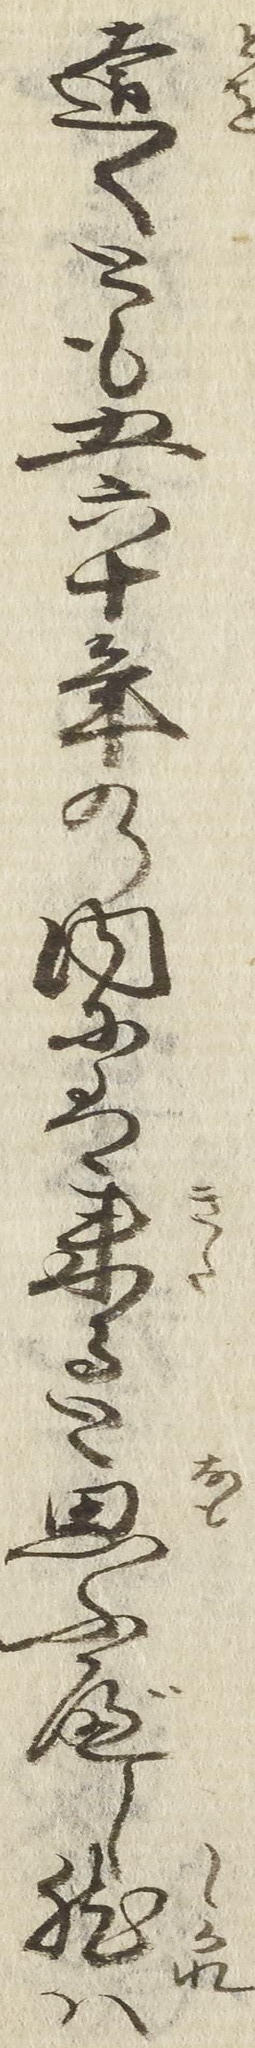遠くとも五六十年の内には来ると思ふべし然は
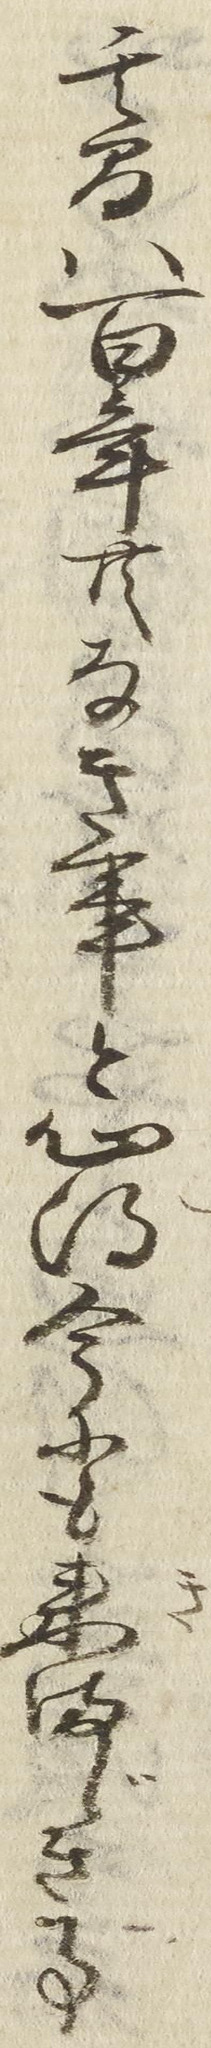其間は百年共なき事と心得今にも来まじき事
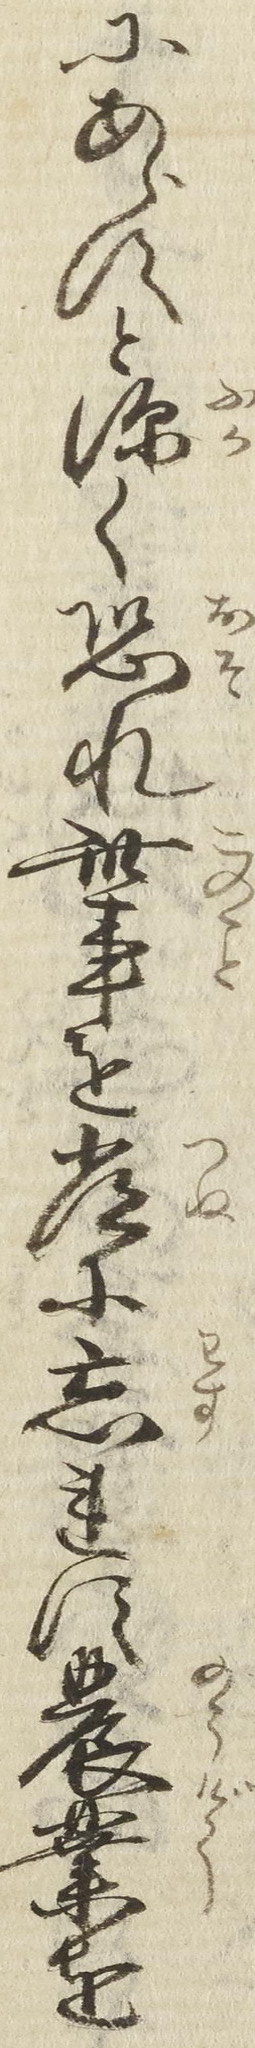にあらすと深く恐れ此事を常に忘れす農業を
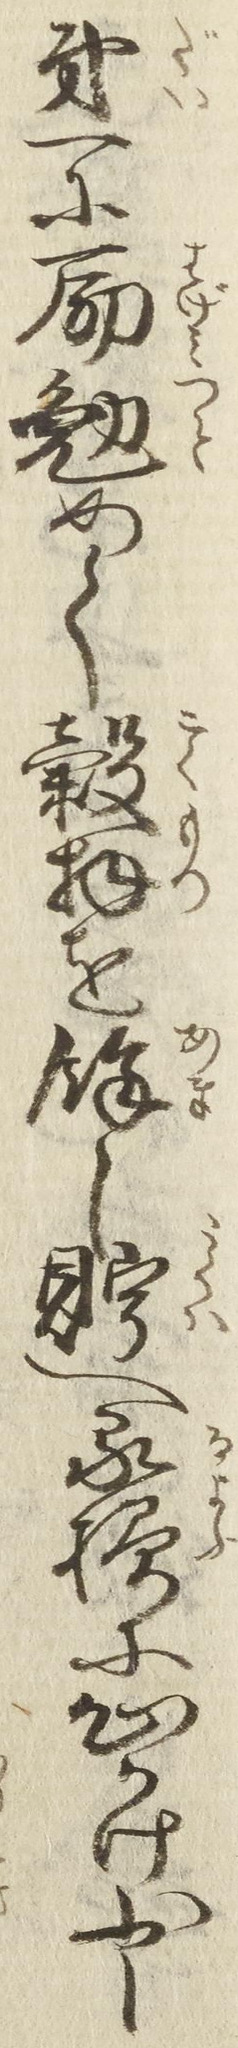第一に励勉めて穀物を余し貯へ累様に心かけ少し
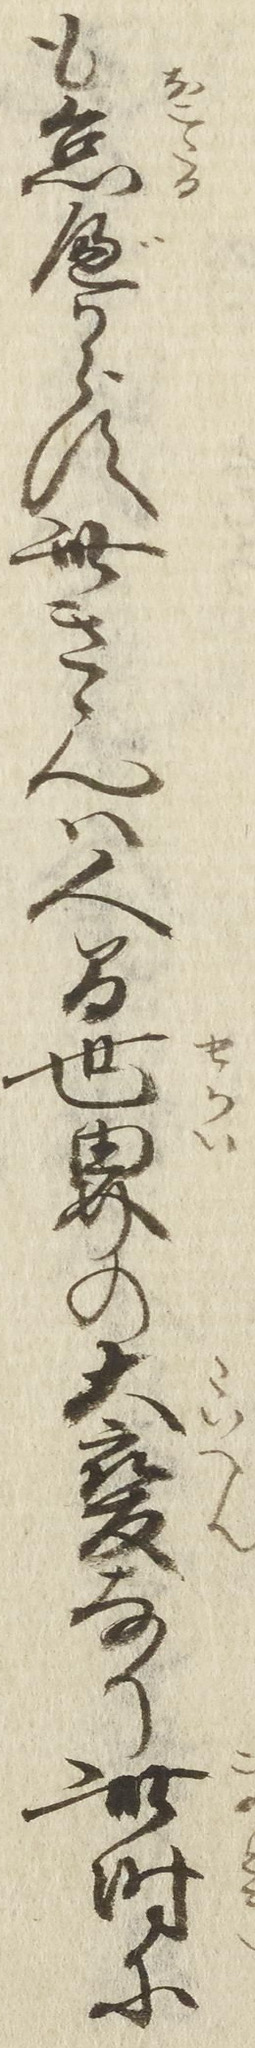も怠べからす此きゝんは人間世界の大変なり此時に
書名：天明奇畧　全
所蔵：東京大学地震研究所図書室 Earthquake Research Institute Library, The University of Tokyo, JAPAN
